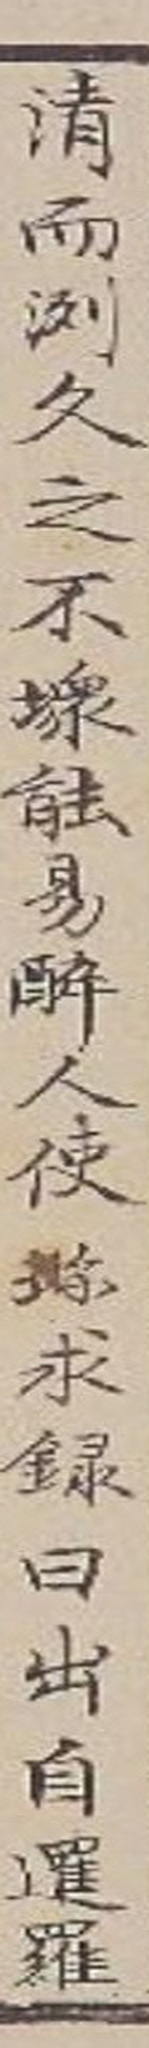清而洌久之不壊能易酔人使琉求録曰出自暹羅
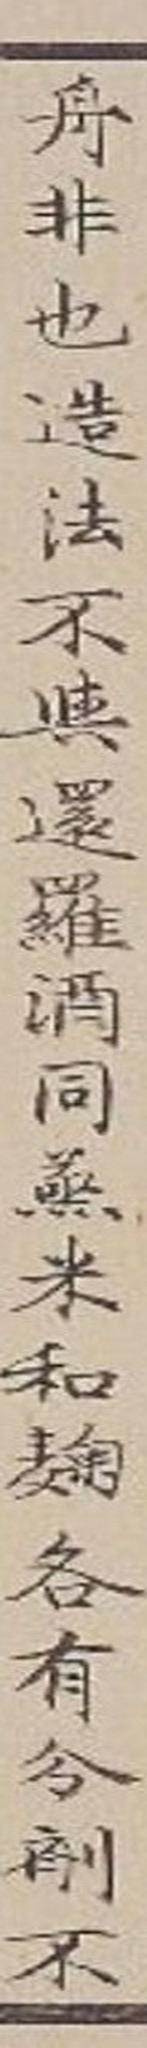舟非也造法不与還羅酒同蒸米和麴各有分剤不
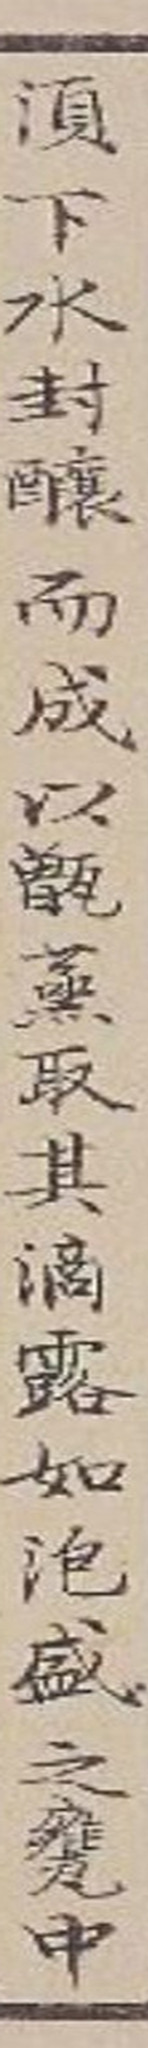須下水封釀而成以甑蒸取其滴露如泡盛之甕中
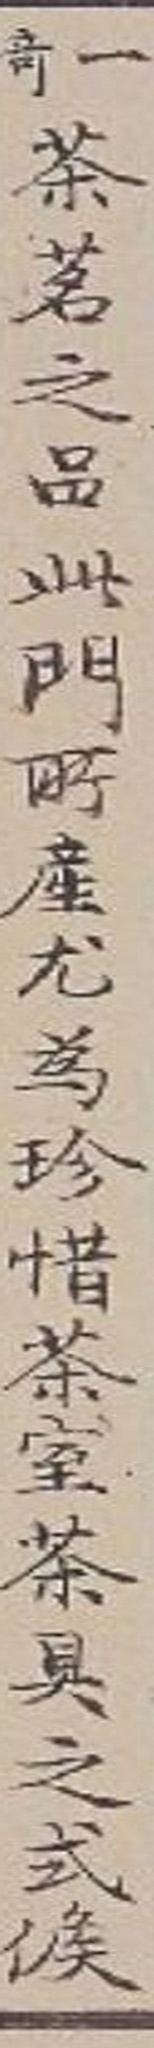一奇茶茗之品此門所産尤為珍惜茶室茶具之式候
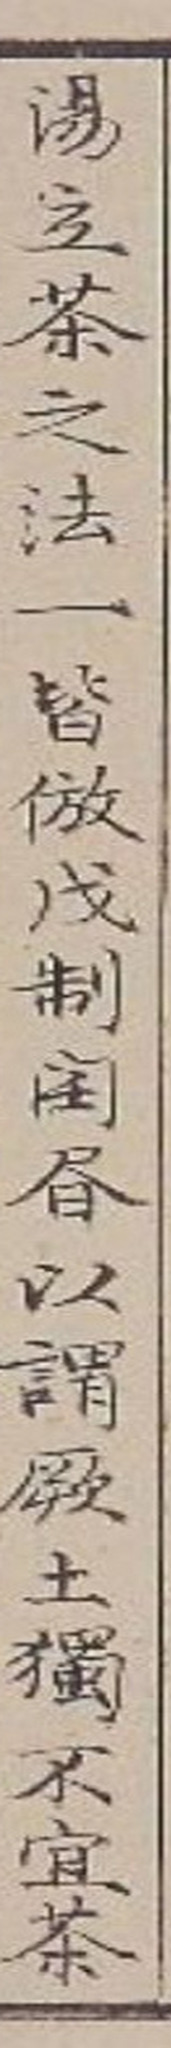湯立茶之法一皆倣戌制以謂厥土独不宜茶

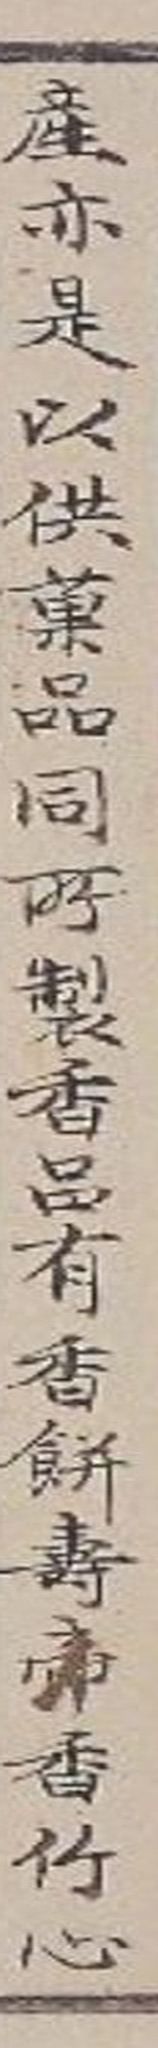産亦是以供菓品同所製香品有香餅寿帝香竹心
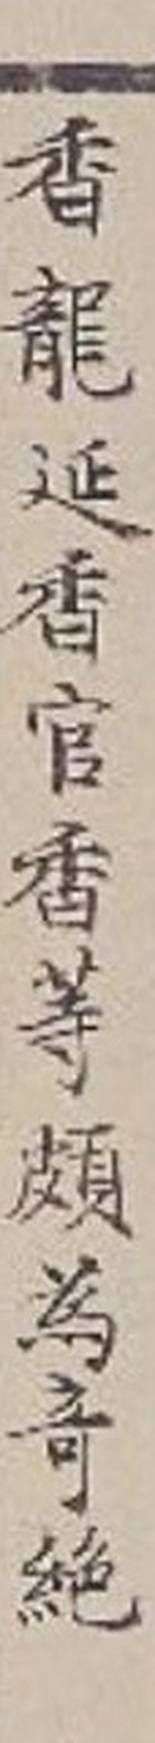香竜延香官香等頗為奇絶
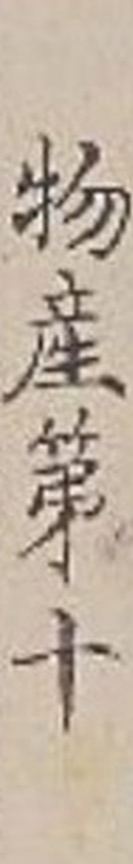物産第十
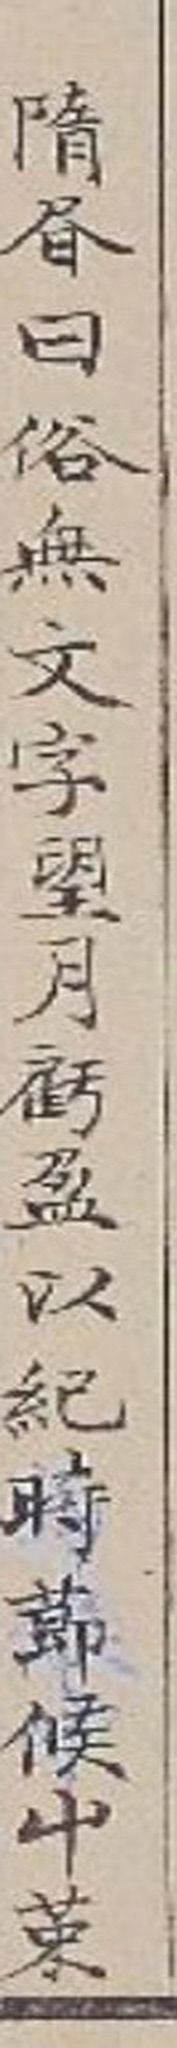隋曰俗無文字望月虧盈以紀時節候
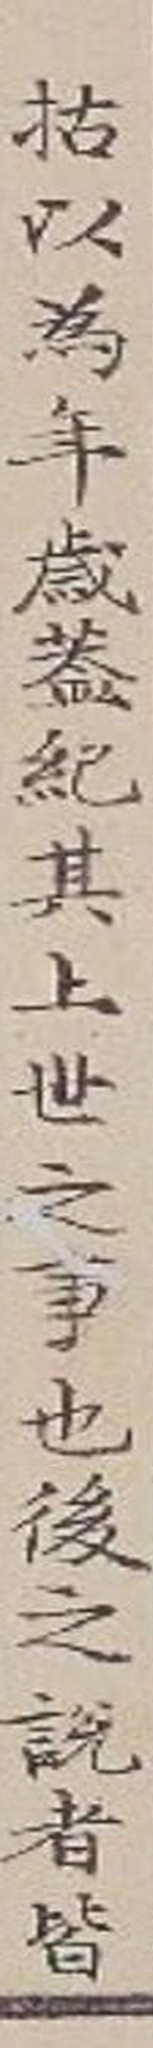枯以為年歳蓋紀其上世之事也後之説者皆
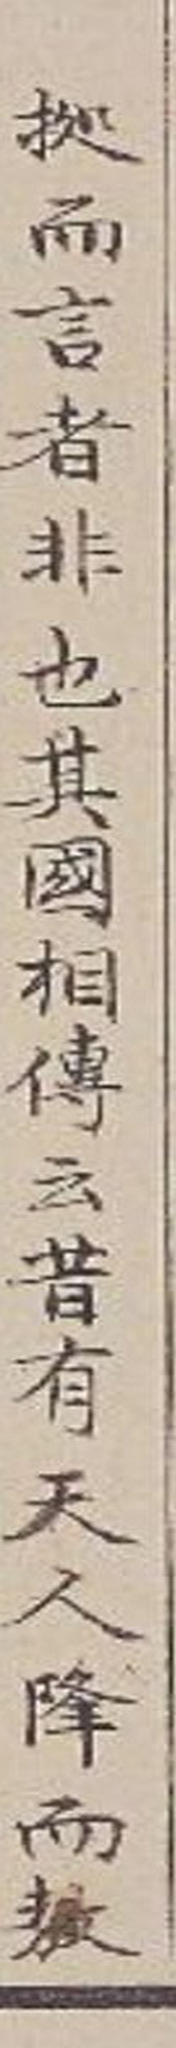拠而言者非也其国相伝云昔有天人而教
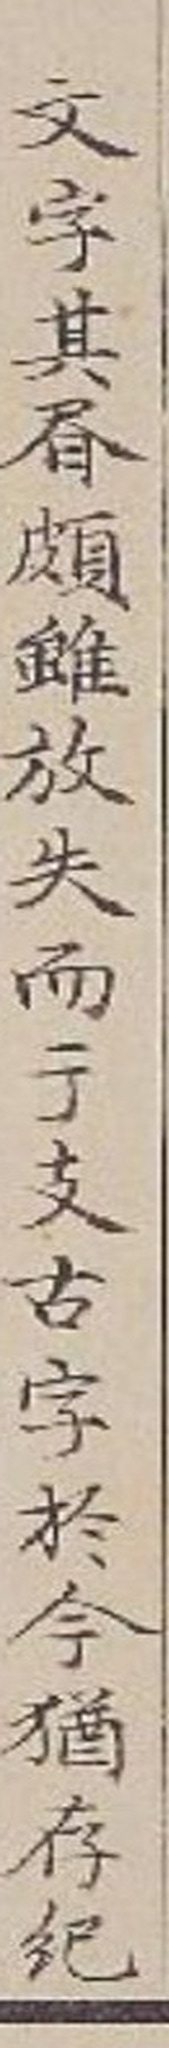文字其頗雖放失而亍支古字於今猶存紀
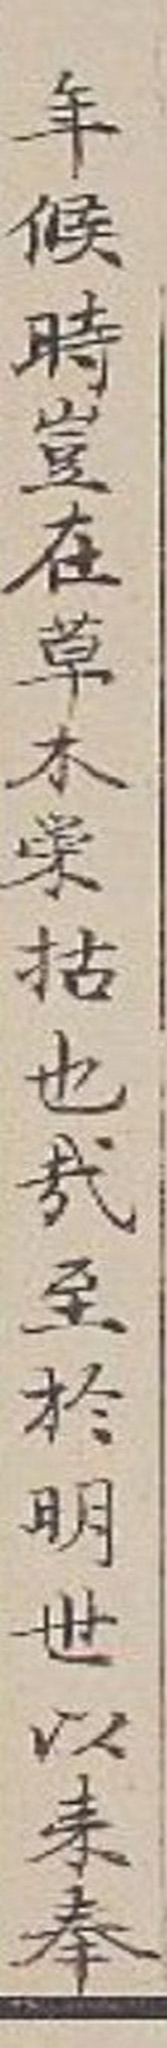年候時豈在草木栄枯也哉至於明世以来奉
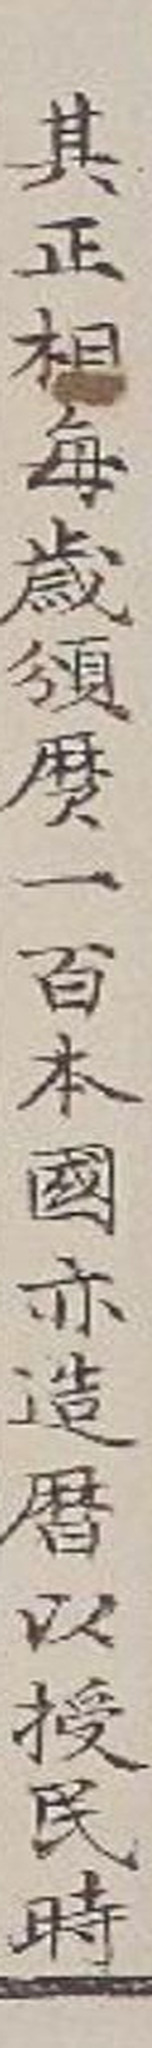其正相毎歳頒歴一百本国亦造歴以授民時
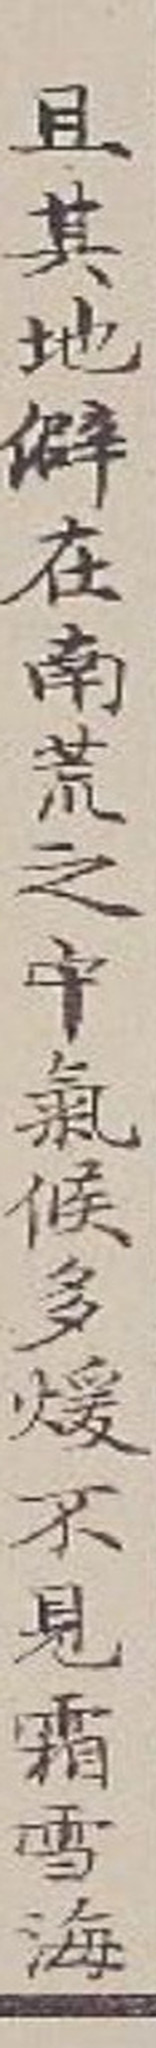且其地僻在南荒之中気候多煖不見霜雪海
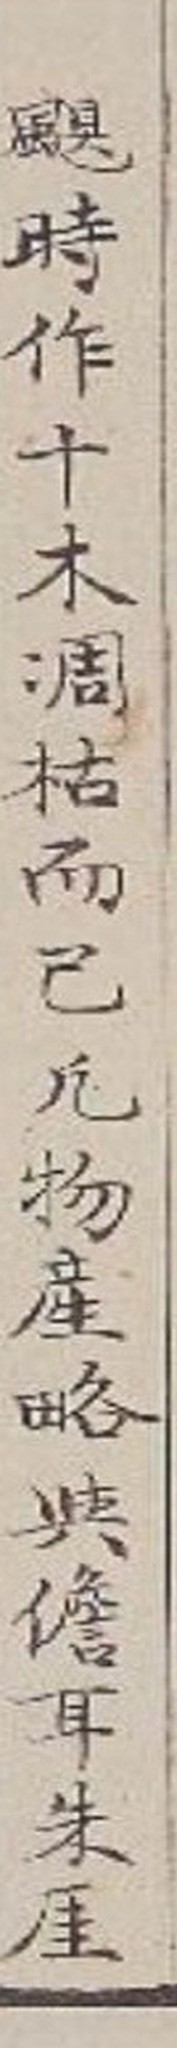颶時作十木凋枯而已凡物産略与儋耳朱厓
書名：南島志 全
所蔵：University of the Ryukyus Library
